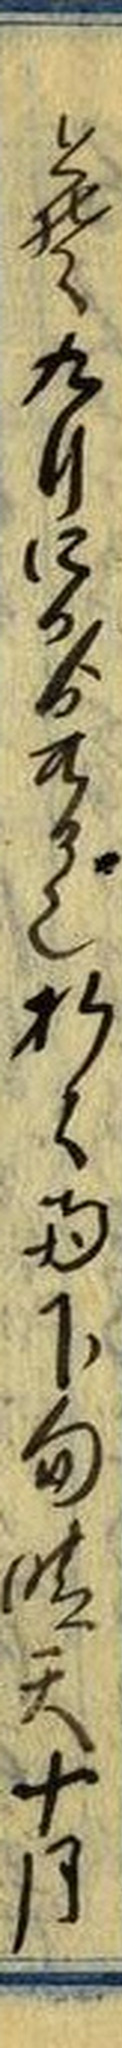とそ九月四日ゟ廿日迄折々雨下旬晴天十月
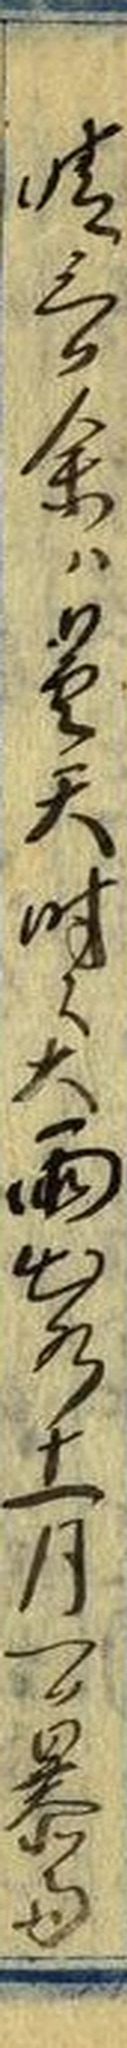晴三日余は曇天時々大雨出水十一月一日暴雨
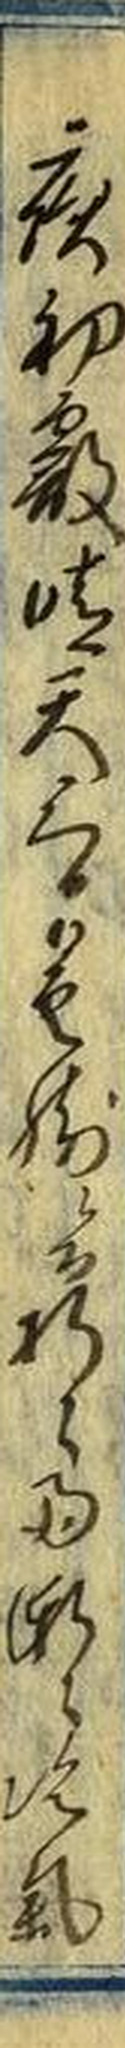夜初霰晴天三日曇勝に而折々雨漸々冷気
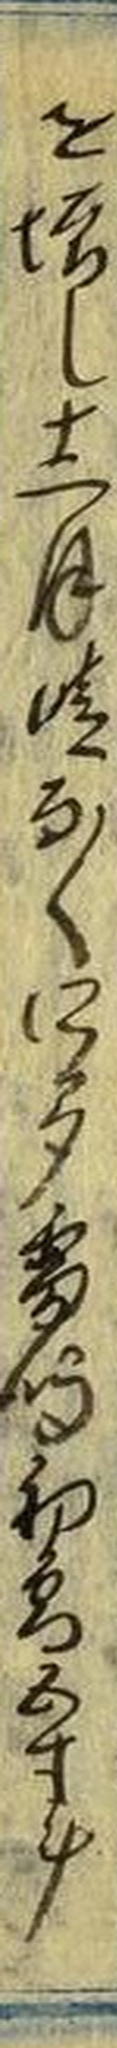を増し十二月晴なく四日夕雷鳴初雪五寸計
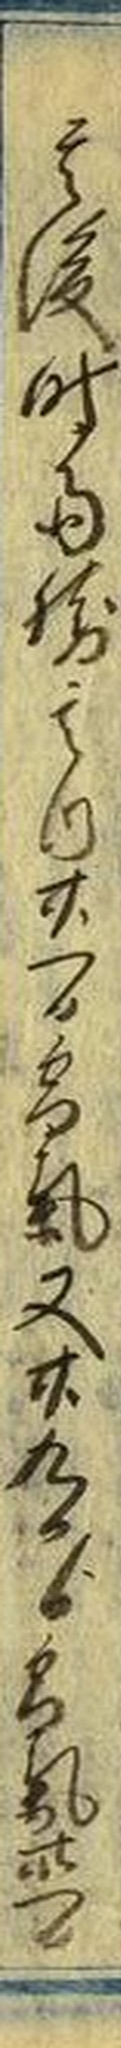其後時雨勝其内廿一日雪気又廿九日ゟ雪気丗一日
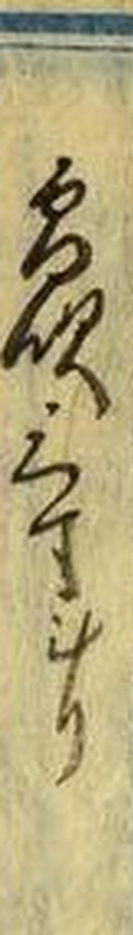雪吹三寸計り
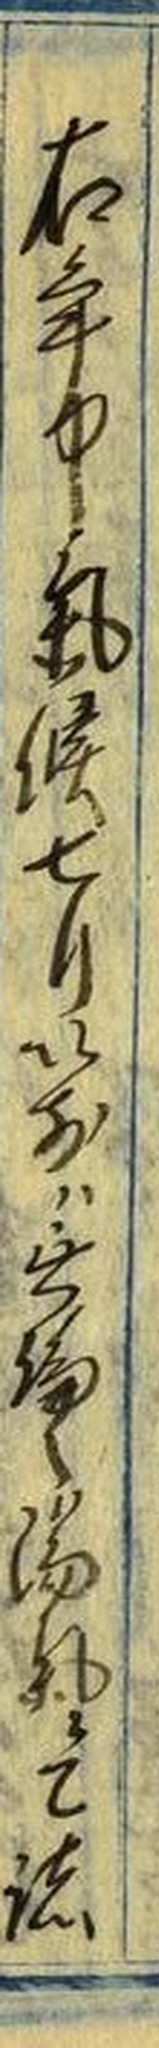右年中気候七月以前は無端之陽気にて諸
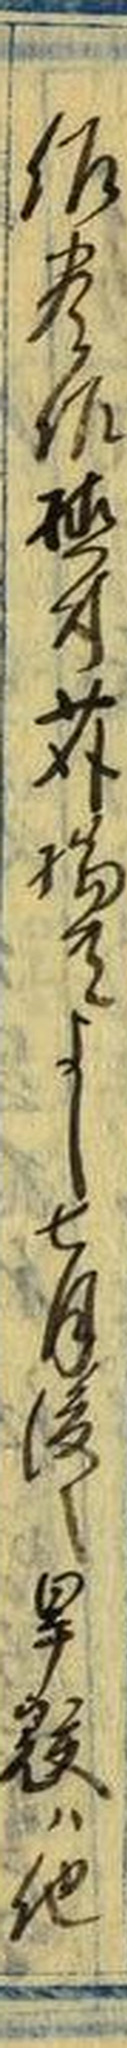作豊作植付刈揚共よし七月後之旱魃は他
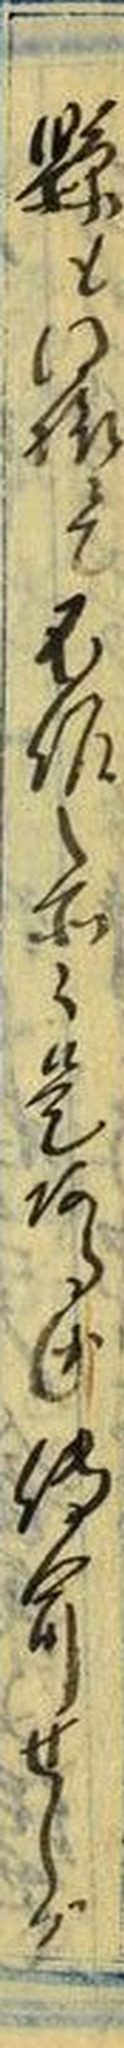県も同様にて不作之所々是ある趣伝聞せしが

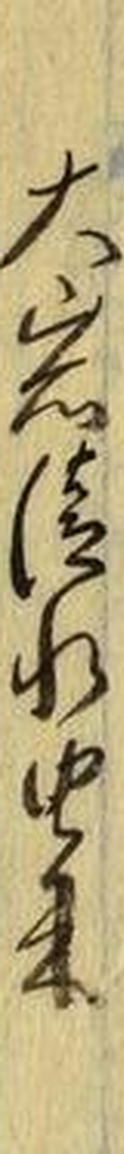大岩清水由来
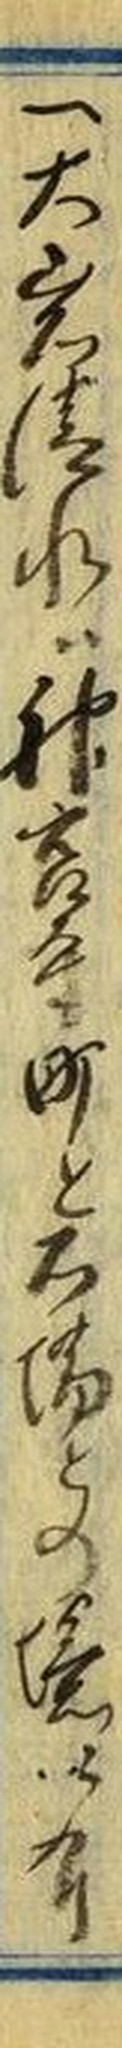一大岩清水は神宮寺町と石場との境に有
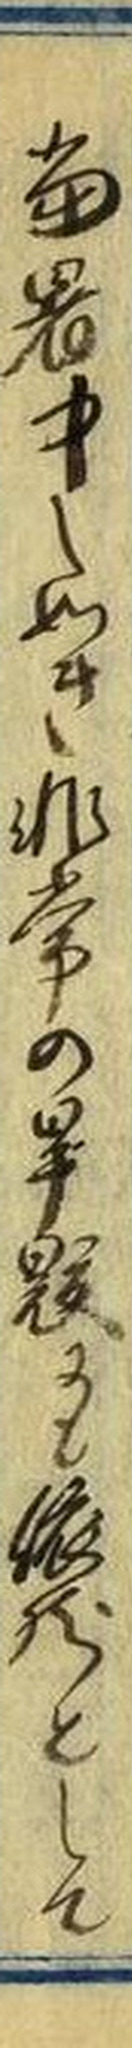当暑中之如き非常の旱魃にも依然として
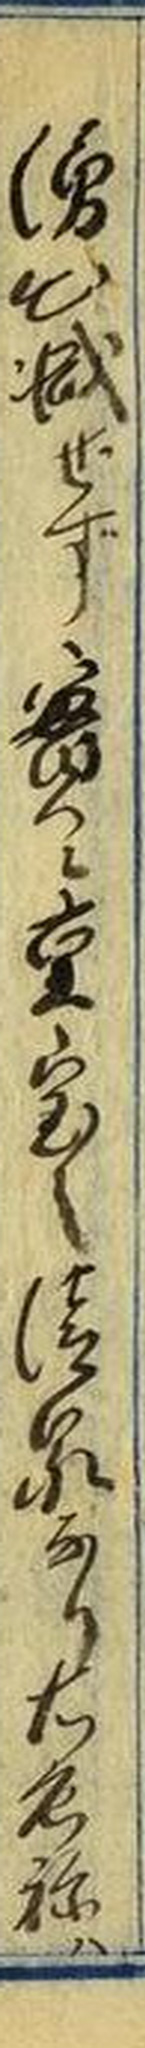湧出減ぜず実に重宝之清泉なり右名称は
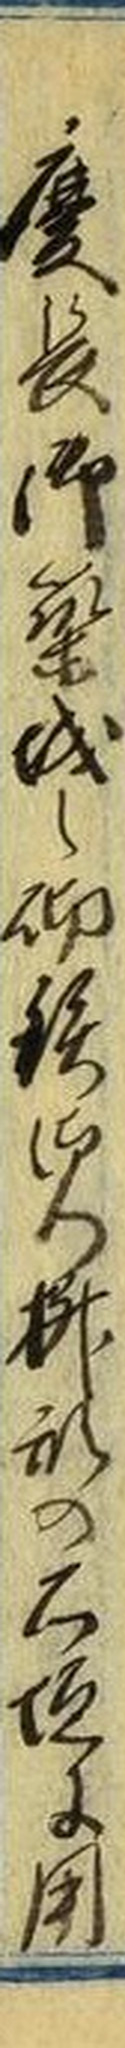慶長御築城之砌鉄御門桝形の石垣に用
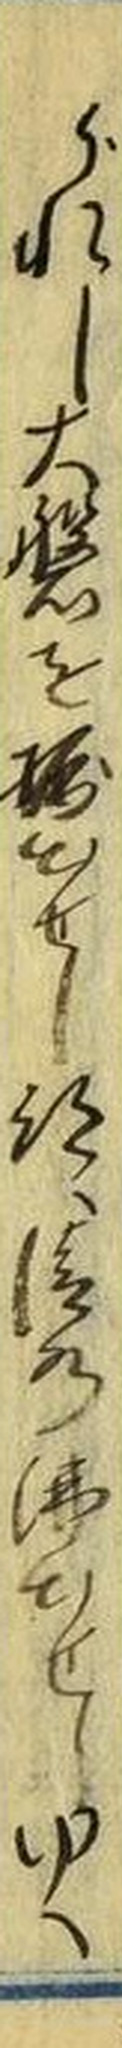られし大磐を掘出せし跡へ清水沸出せしゆへ
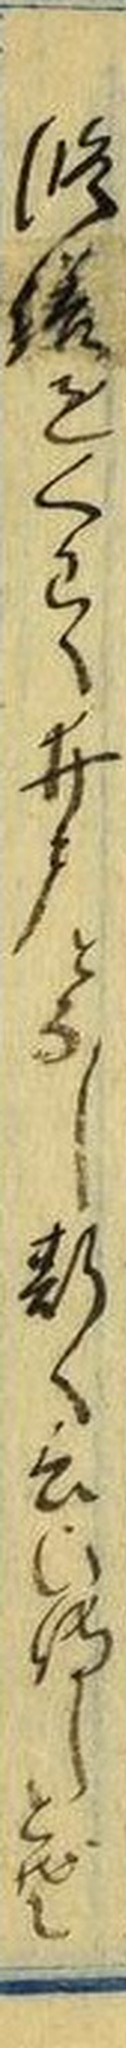修繕をくわへ井戸となし斯く言い伝しとぞ
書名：温古集 五巻
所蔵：福井県文書館 Fukui Prefectural Archives
